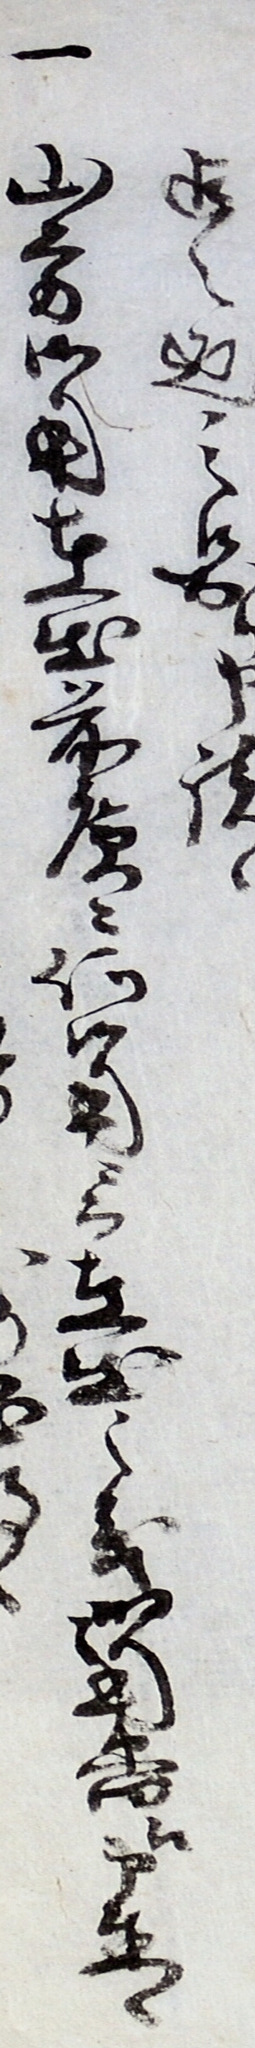一山方御用在出前廣ニ何御用ニ而在出之義御用番江申達候
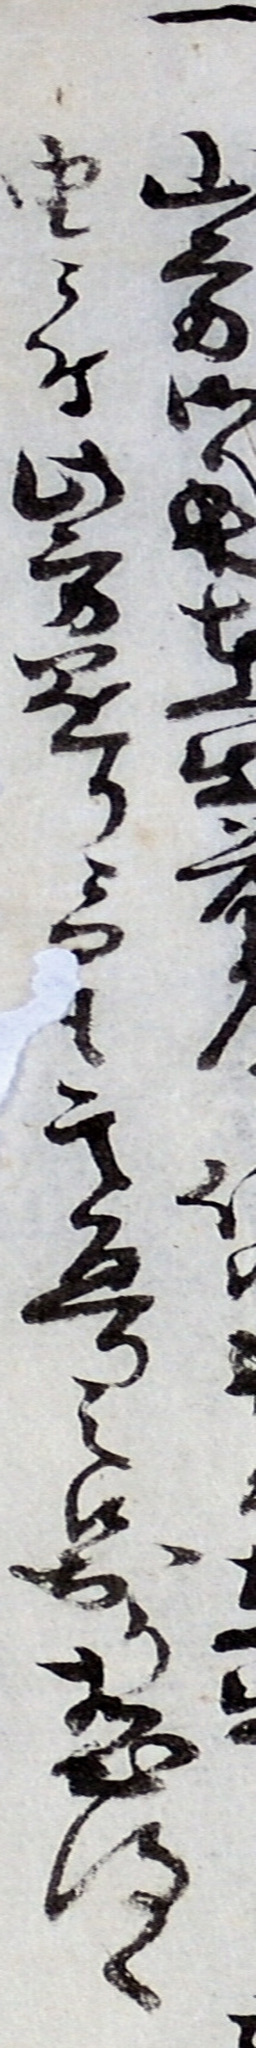由ニ付此方懸りニ而も其通り之図り相心得候
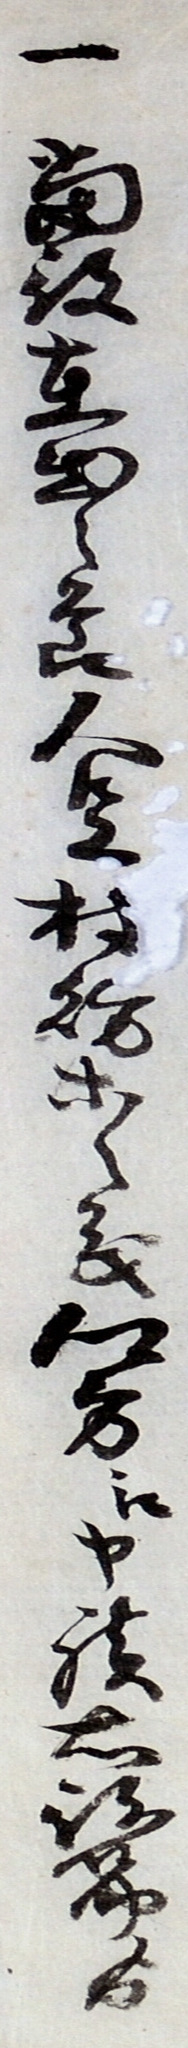一當役在出之節人足村賄等之義郷方江申談右役筋ゟ
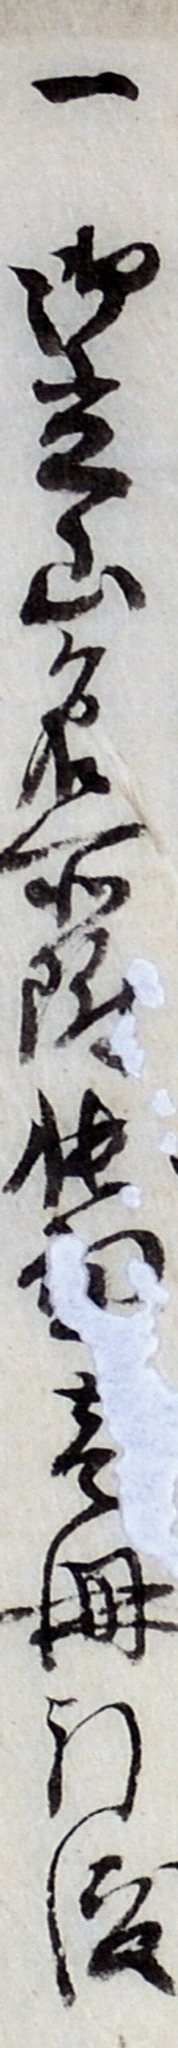一御立山名所附帳面壱冊引渡
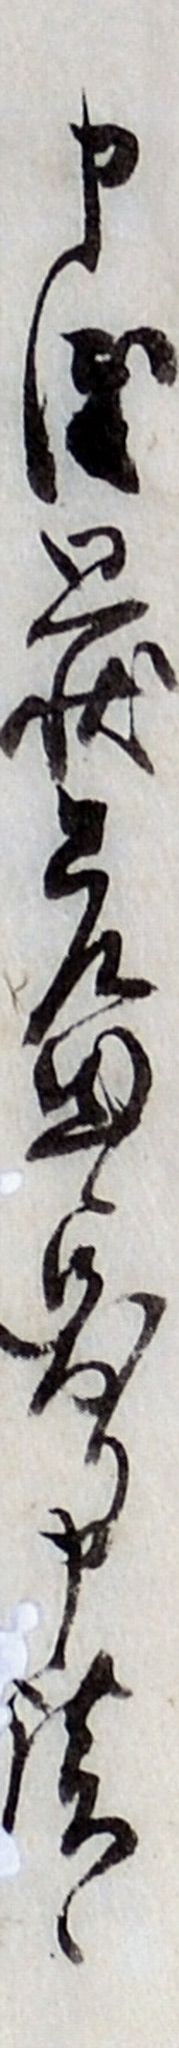申渡廻状差出候図り申談候
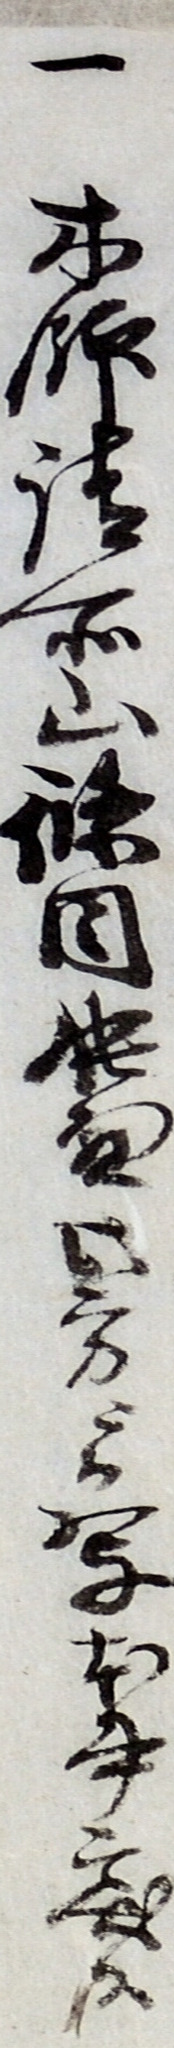一木師請所山條目帳面郷方ニ而写本書戻ス
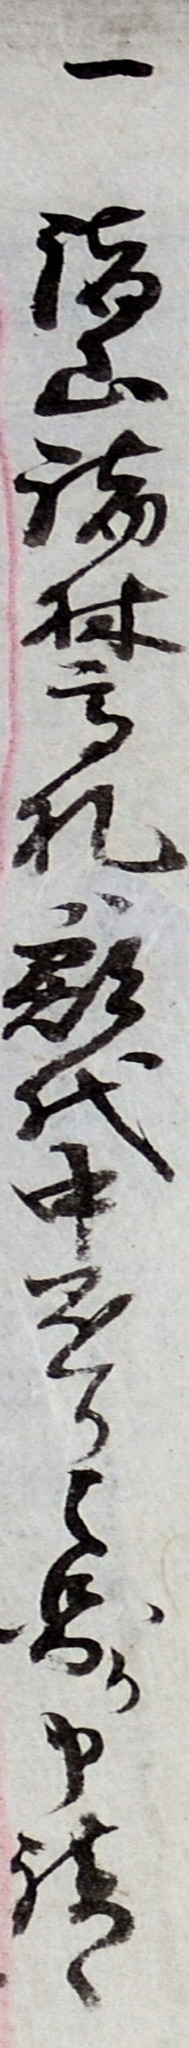一諸山諸林高札ハ郡代中懸り与図り申談候
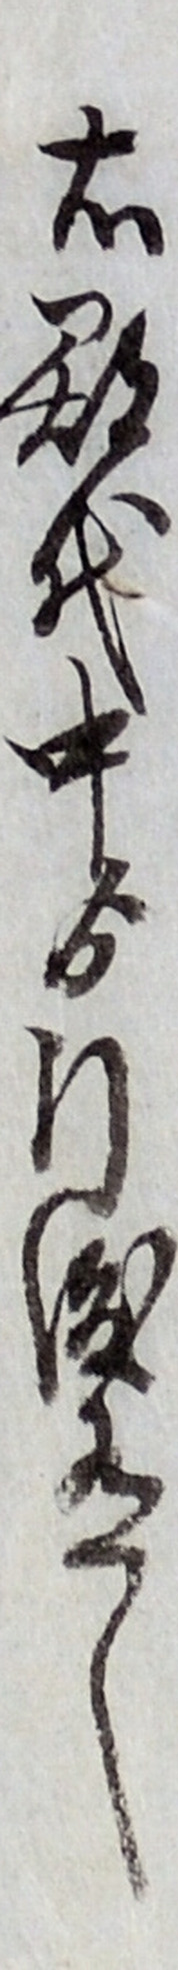右郡代中ゟ引渡有之
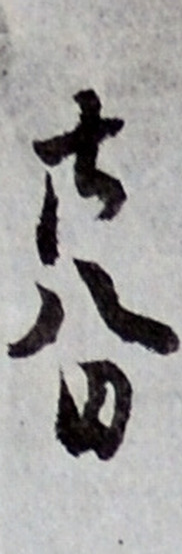廿八日
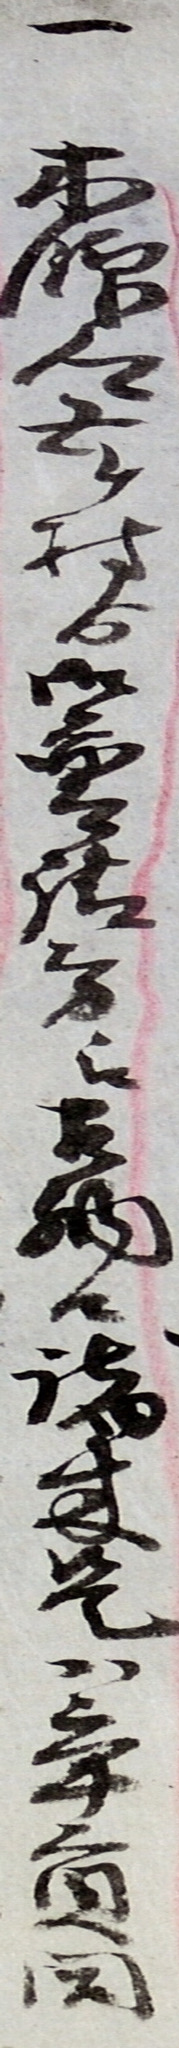一木師郷六ヶ村ゟ御普請方江相納候諸木是ハ年貢同
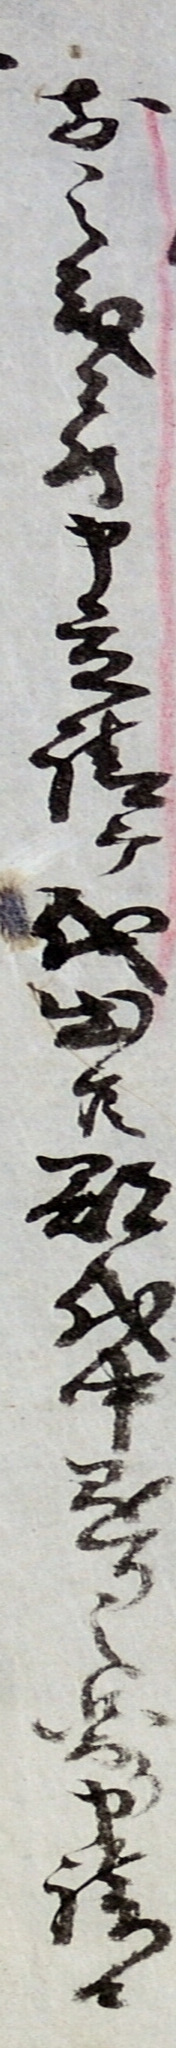前之義ニ付申立請ケ伐出共郡代中懸り与図り申談候
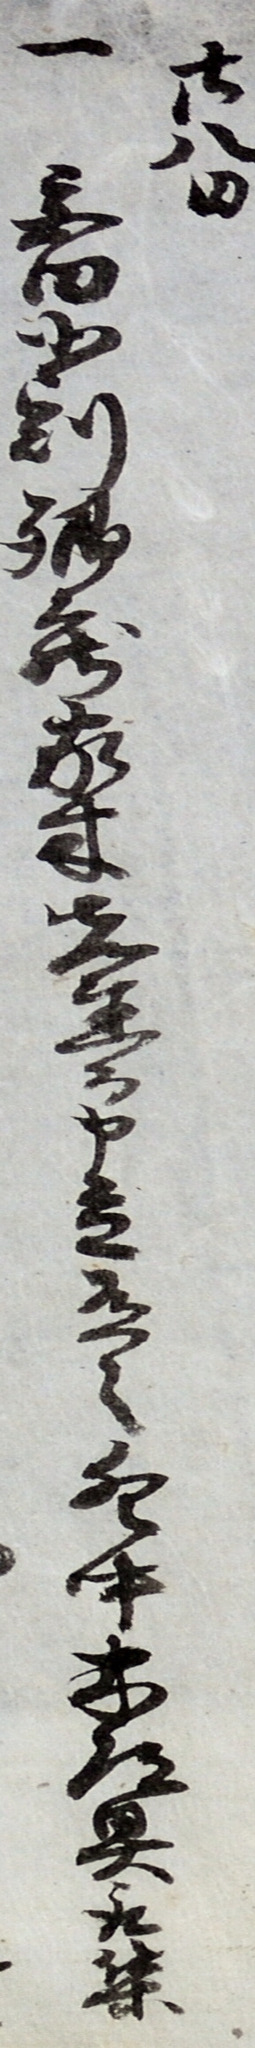一宮田北割郷蔵家来先達而申立有之卯中木道具取集
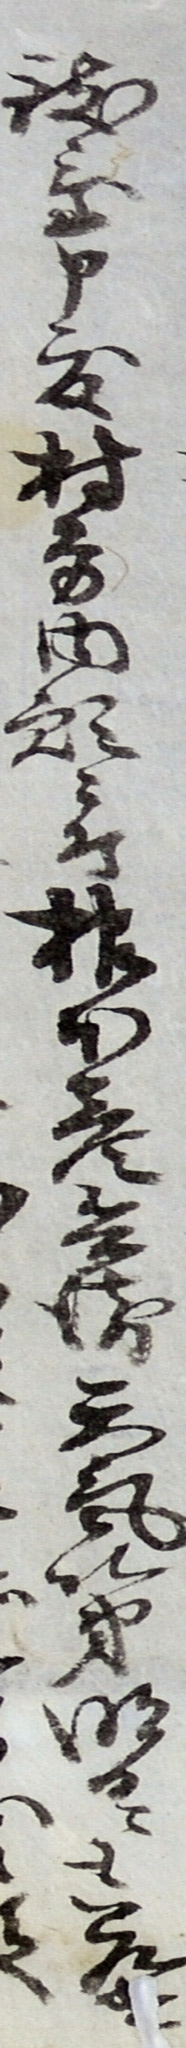致置申度村方内願ニ付根本彦兵衛天気次第明日ニも差出
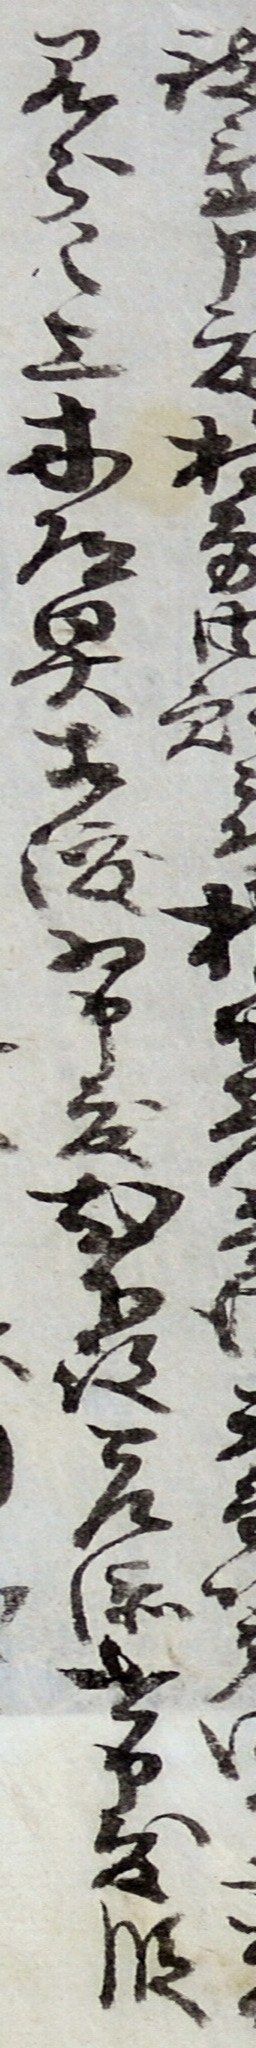見分之上木道具相渡為申度尤下役差添遣申度段
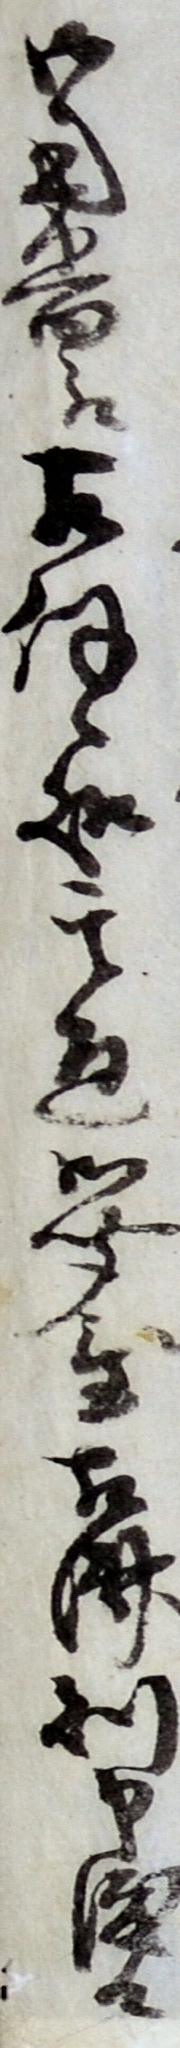御用番江相伺候処其通相聞置相済則申渡候

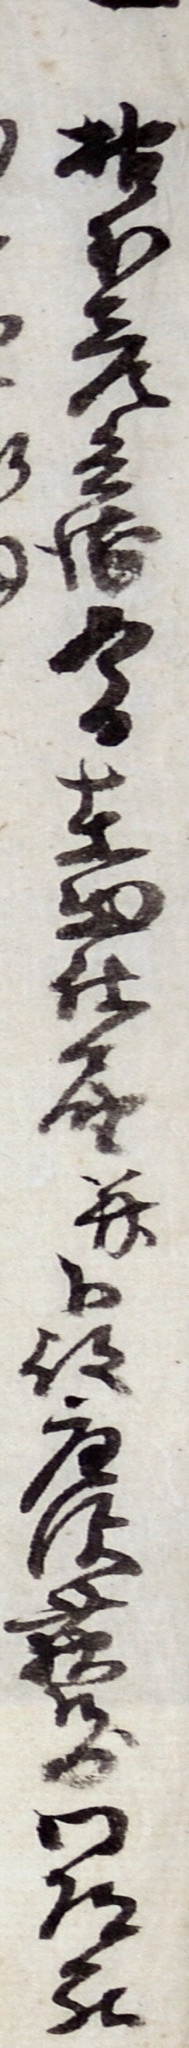一根本彦兵衛今日在出仕届并下役唐沢萩左衛門同道罷
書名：御山奉行御用留
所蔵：伊那市立高遠町図書館・合同会社AMANE
